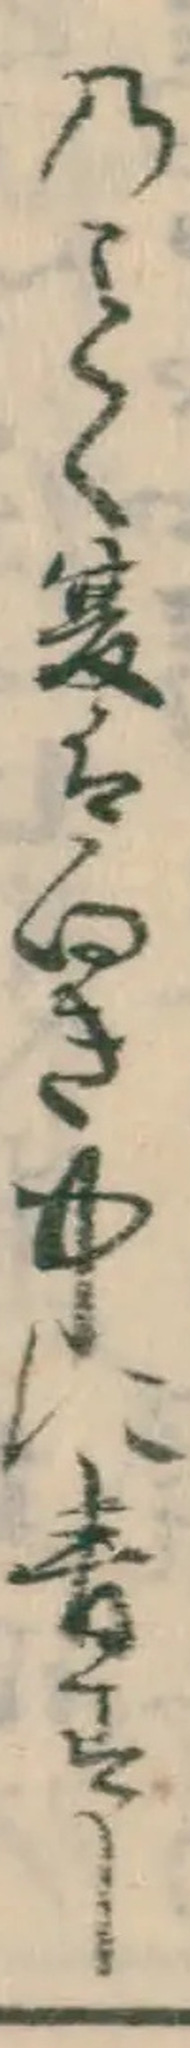のことく夏は白き中に青すし
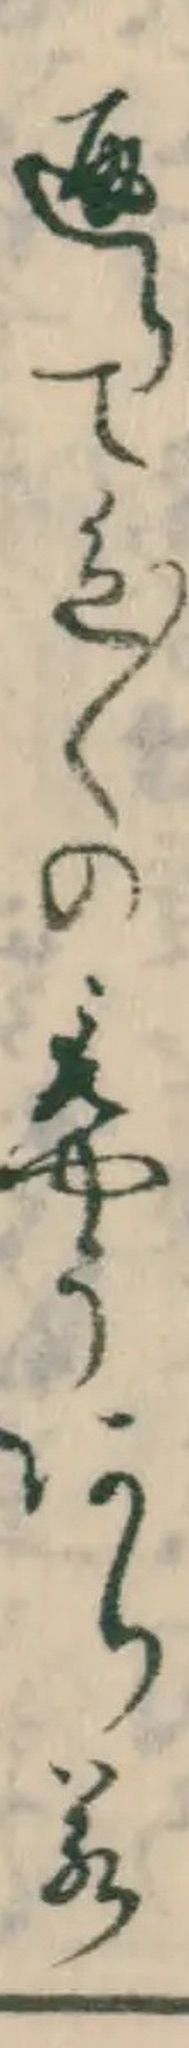通りて色〳〵のもやうあり若
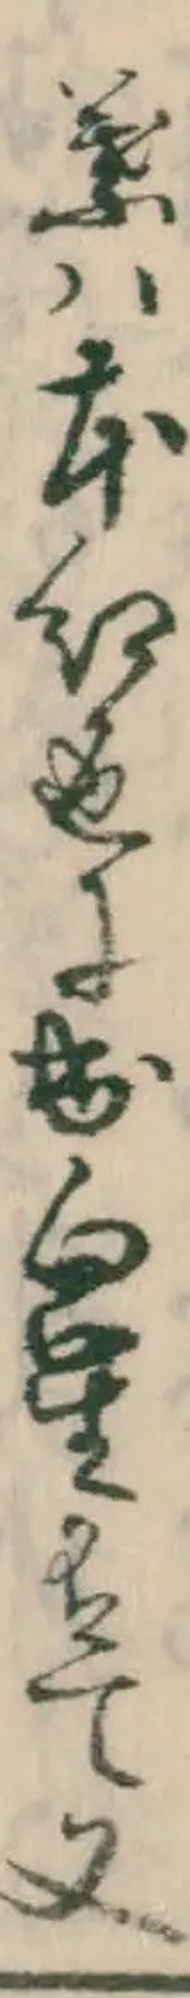葉は本紅色に出白星有て又
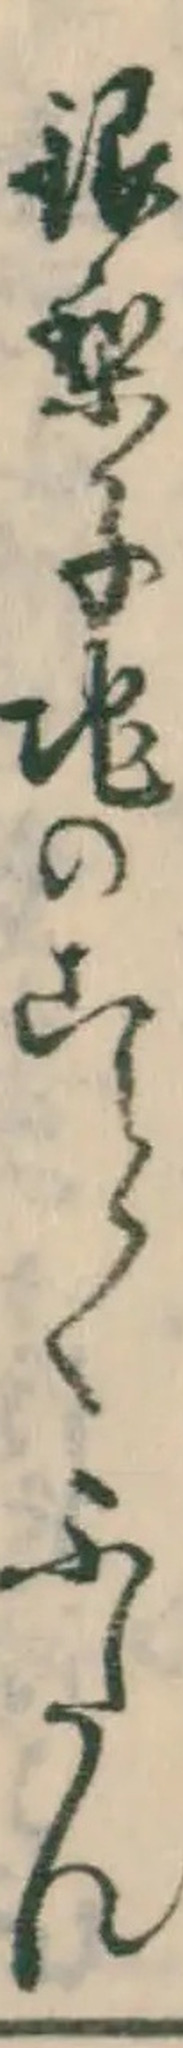銀梨子地のことくふたん
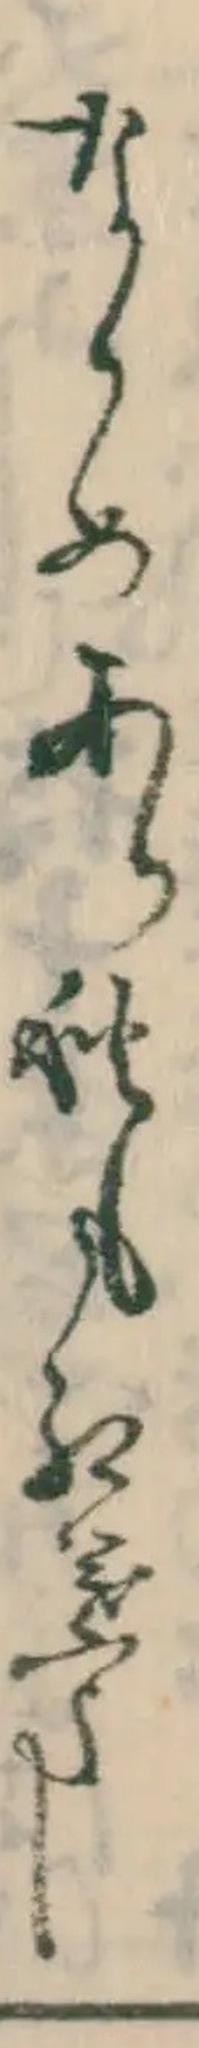なかめあり秋も紅葉よし
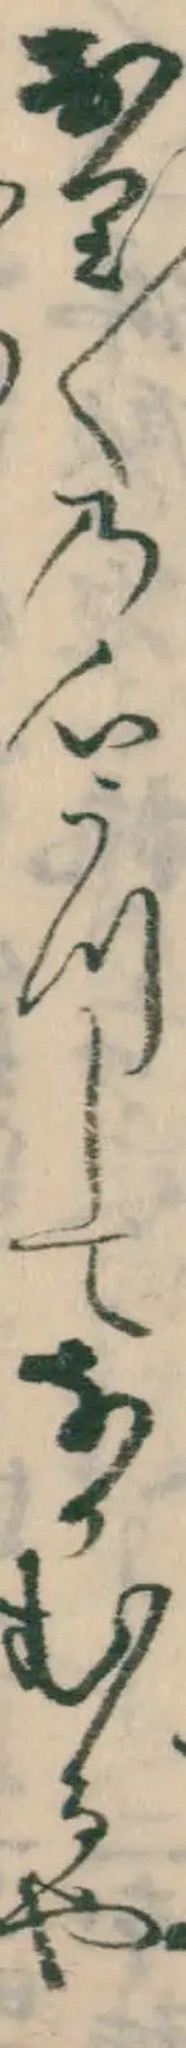おり〳〵の心うつしてなかむるや
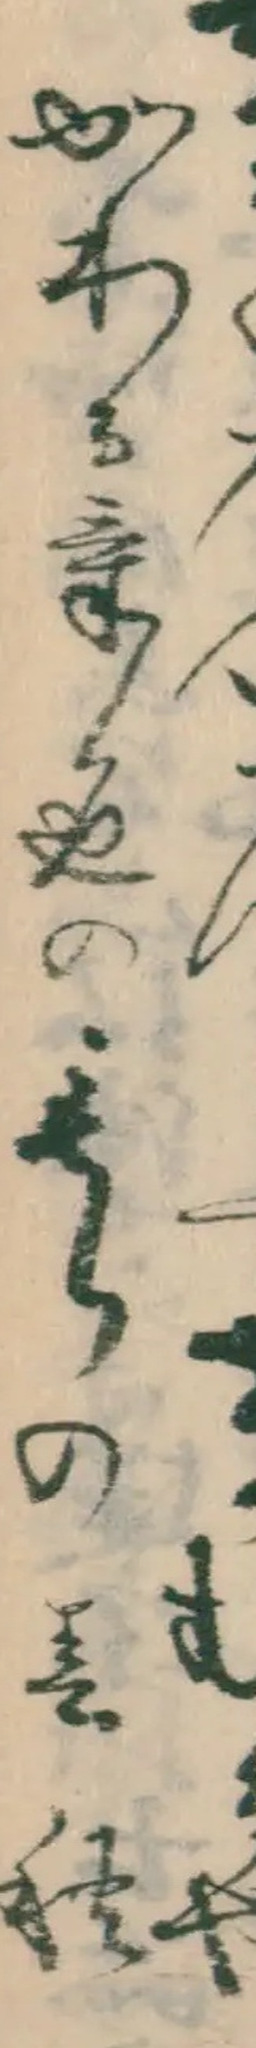かわる気色のもりの春秋

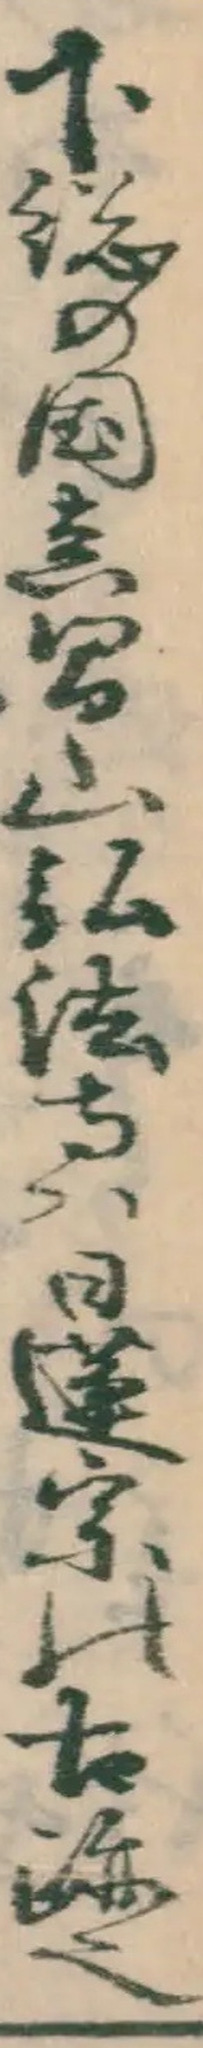真間下総の国真間山弘法寺は日蓮宗の古跡也
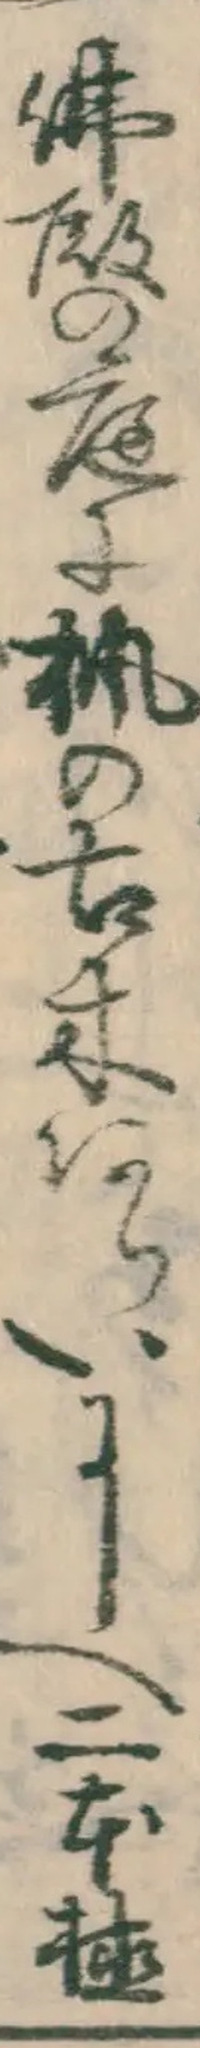佛殿の庭に楓の古木ありいにしへ二本植
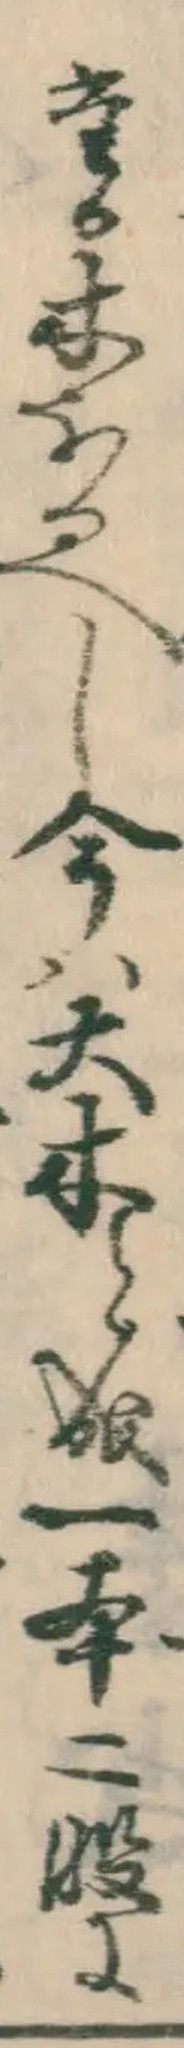たる木なるへし今は大木と成一本二股に
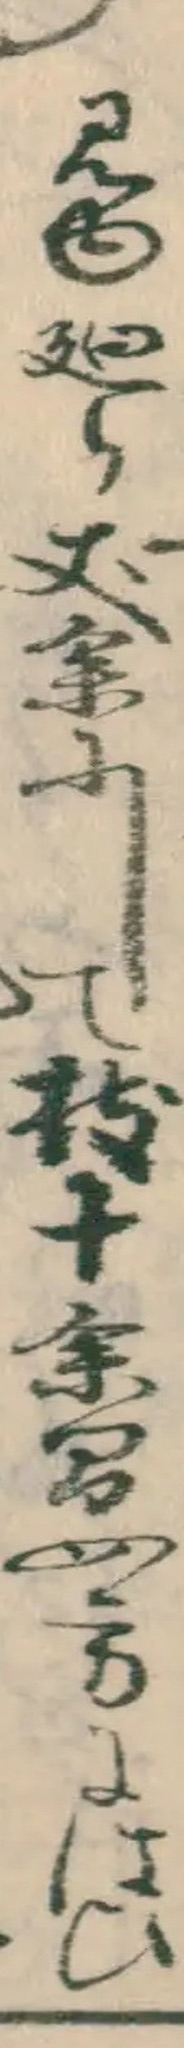見ゆ廻り丈余にして枝十余間四方にはひ
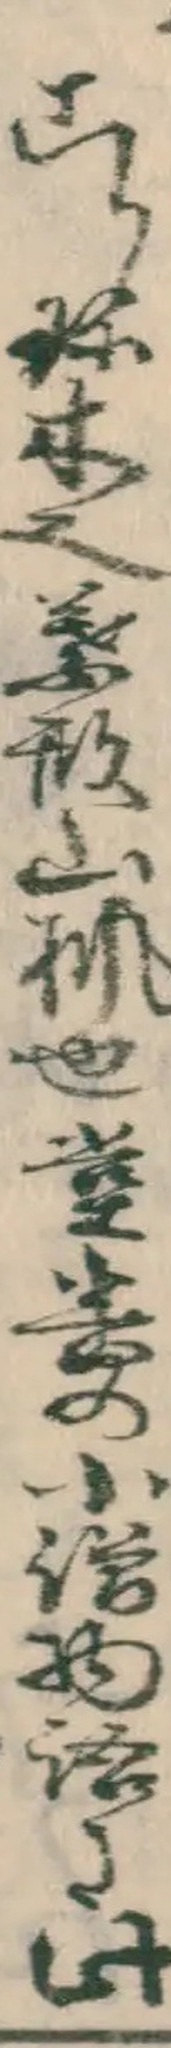こり珍木也葉形山楓也堂番の小僧物語に此
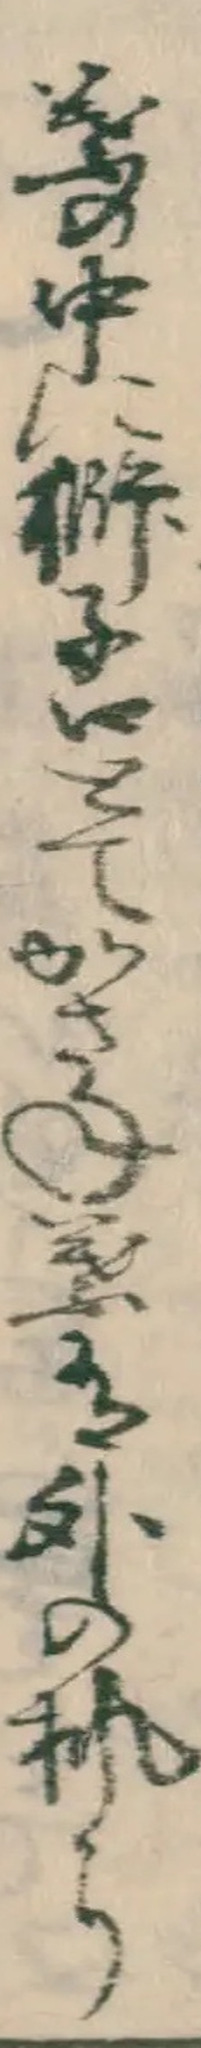葉の中に獅子口とてかさね葉有外の楓に
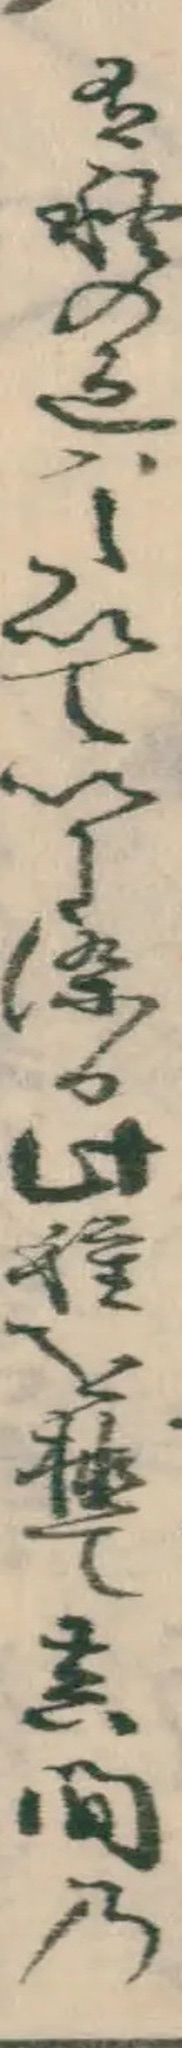有秋の色はたいていに染る此種を植て真間の
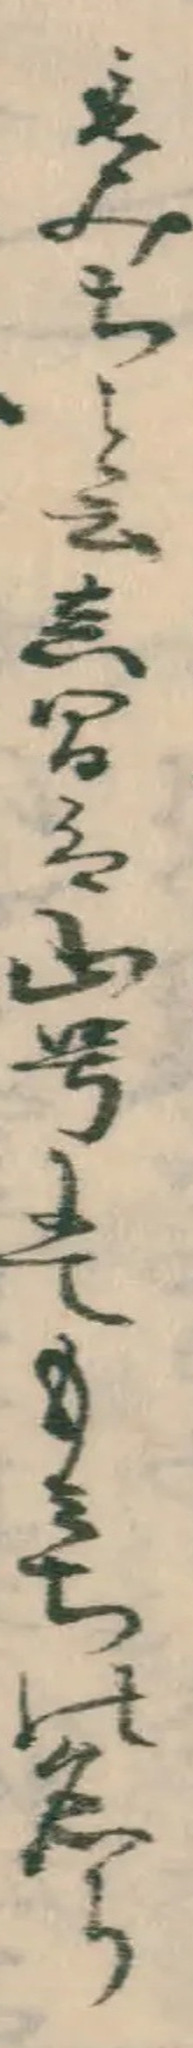もみちと云真間は山号にてもみちの名に
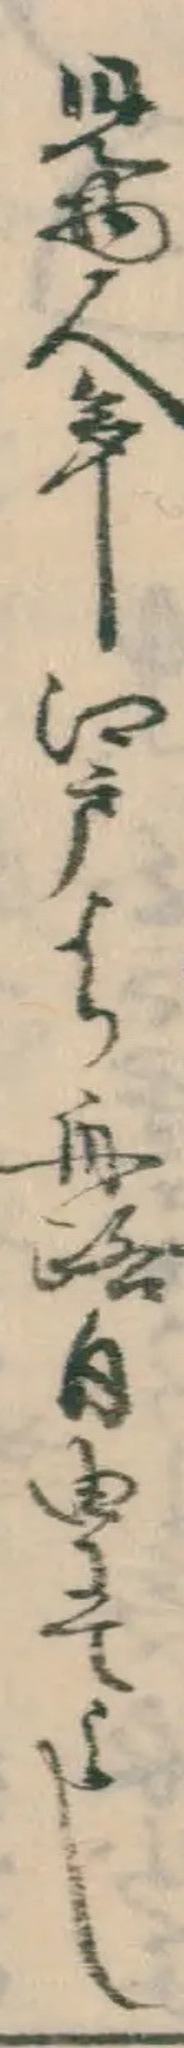見物人多し江戸より舟路自由にてよし
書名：紅葉集
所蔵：国立国会図書館 National Diet Library, JAPAN
